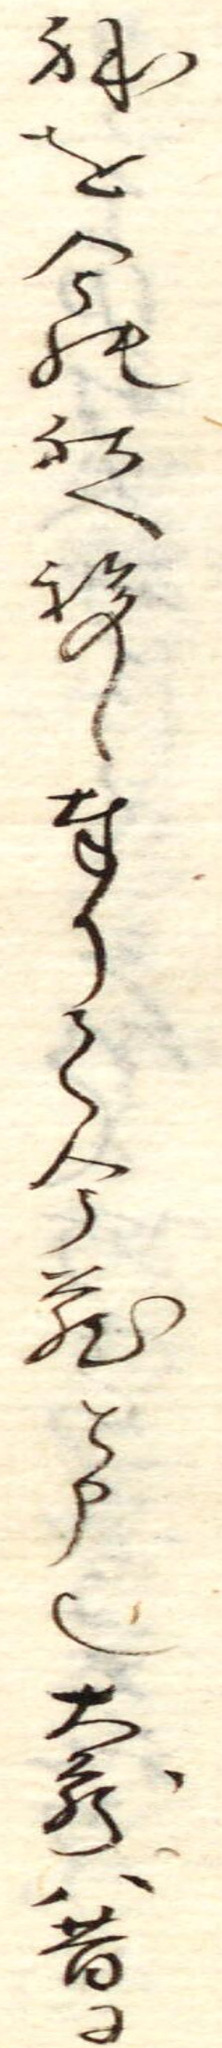躰を今の社へ移し奉りて今蔵と申也大蔵は昔に
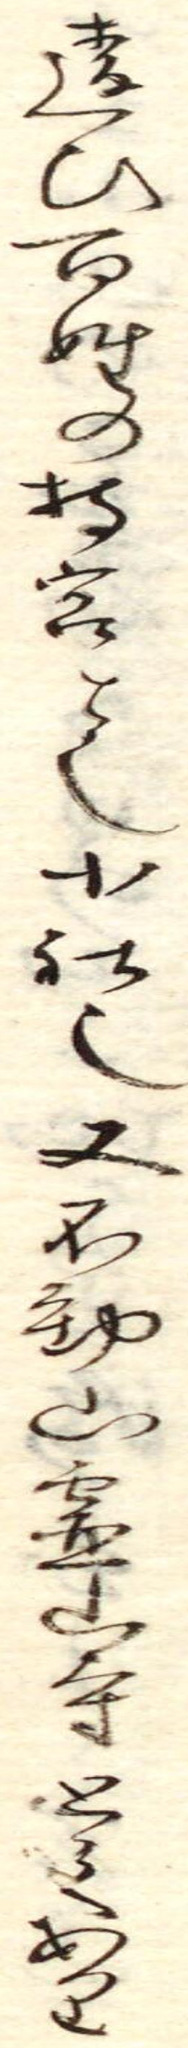違ひ百姓の持宮と也小社又不動産霊山寺とてあり
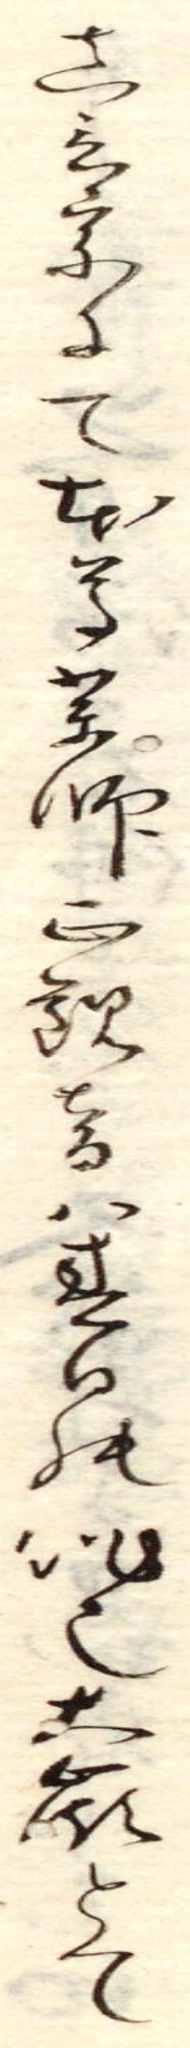真言宗にて本尊薬師正観音は春日の作也大嶺とて
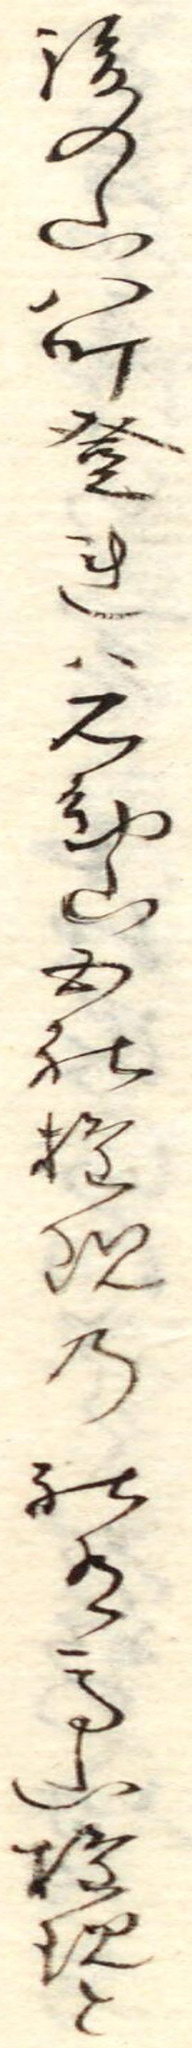後の山八町登連は不動山五社権現の社有高山権現と
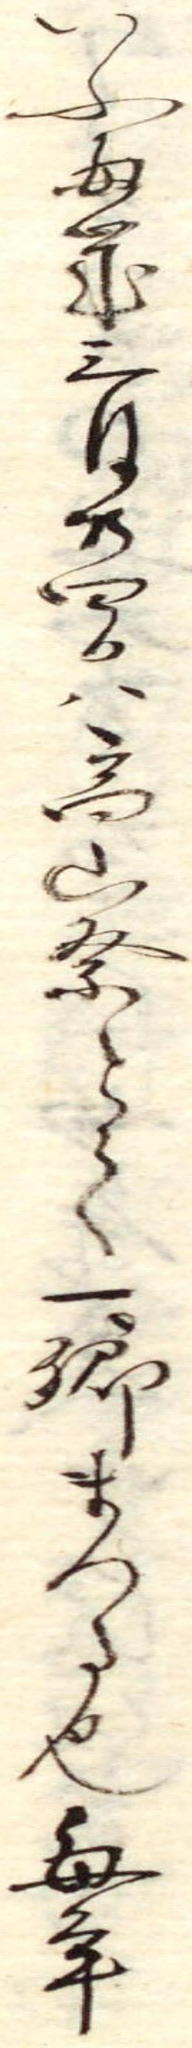いふ毎歳三月廿四日は高山祭とて一郷まつる也毎年
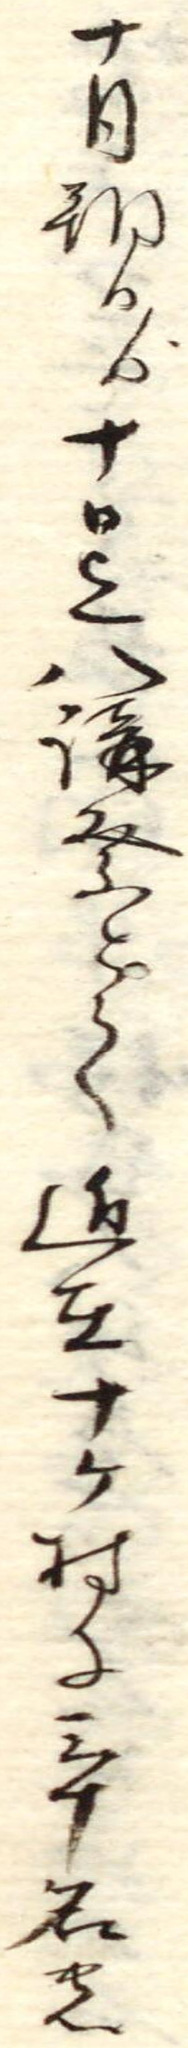十月朔日ゟ十日迄八講祭とて近在十ヶ村千三十名の
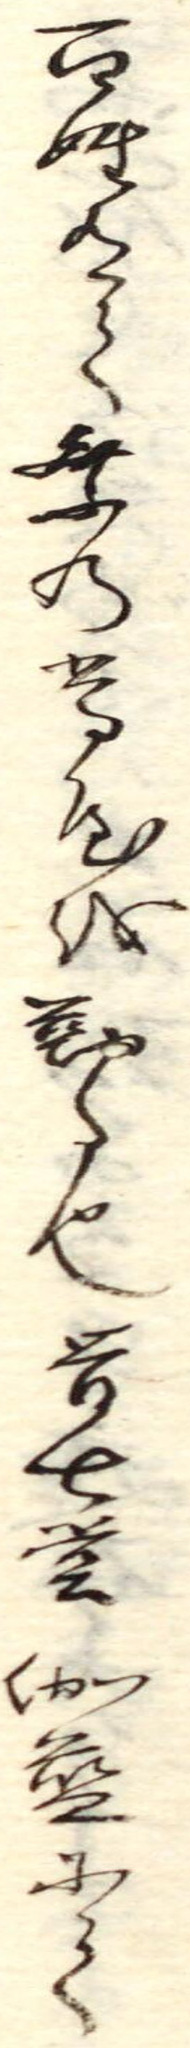百姓有て祭の当屋を勤る也昔七堂伽藍にて
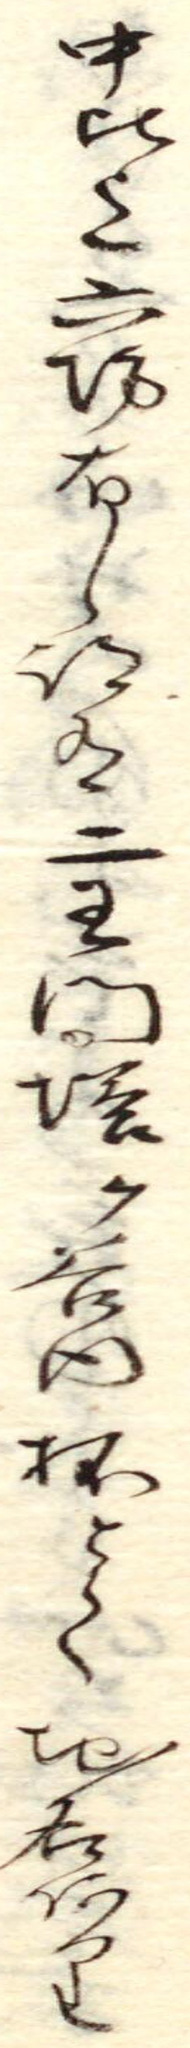中比迄六坊有し跡有仁王門塔ヶ谷内抔とて地名あり
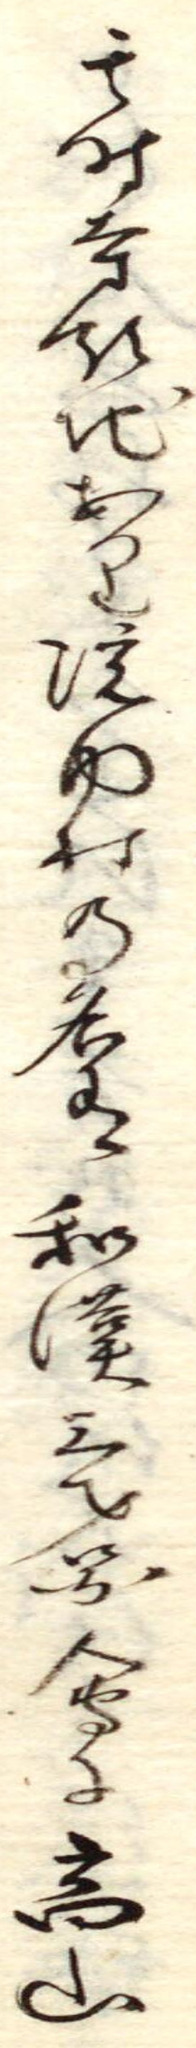其時寺領地あり院内村の名有和漢三才図会に高山
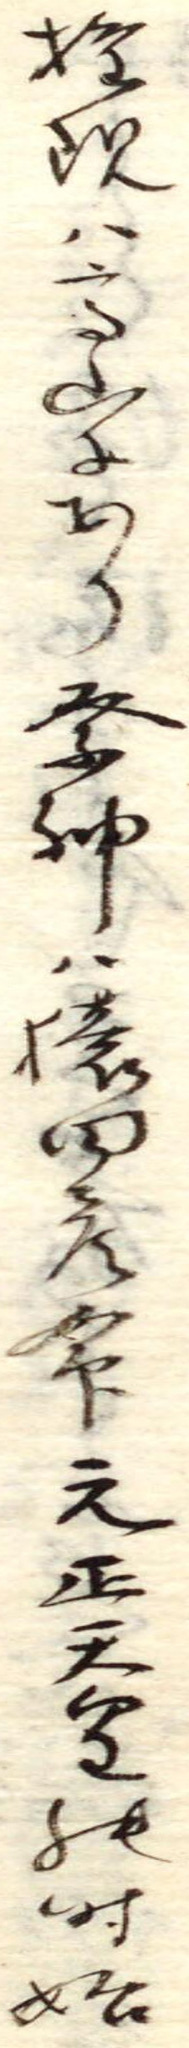権現は高山にあり祭神は猿田彦命元正天皇の時始
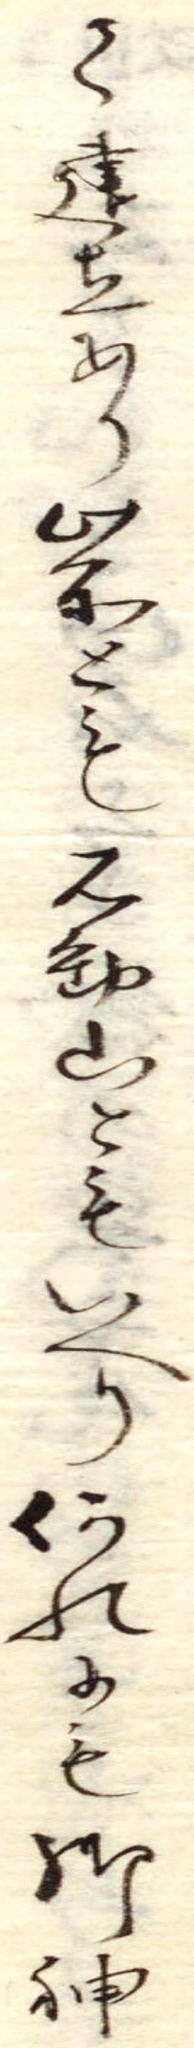て建立あり此所とも石動山ともいへり何れにも御神
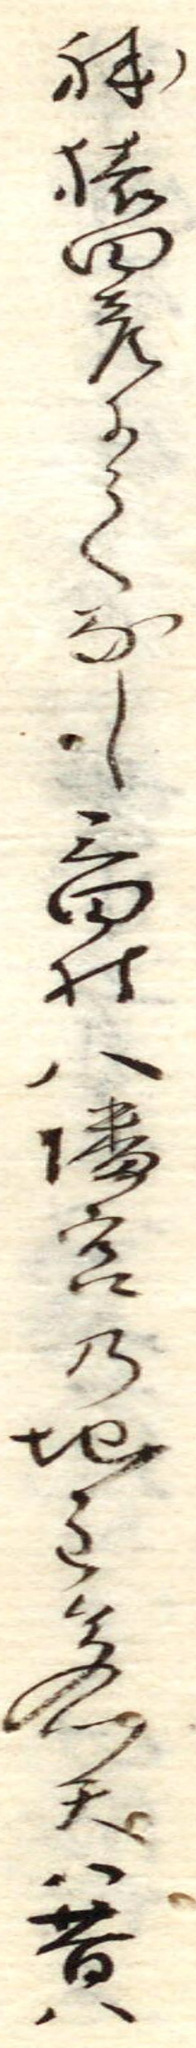躰猿田彦にてなし三田村八幡宮の地主多門天は昔は
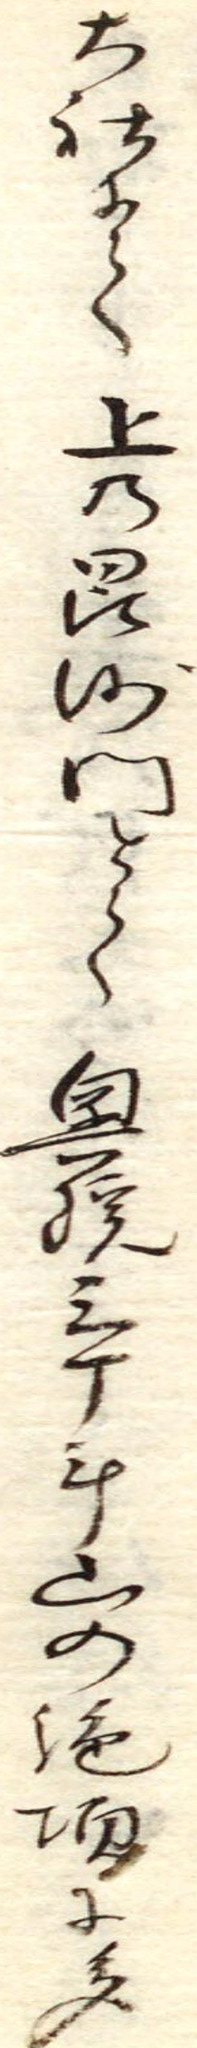大社にて上の毘沙門とて奥院三十斗山の絶頂に多
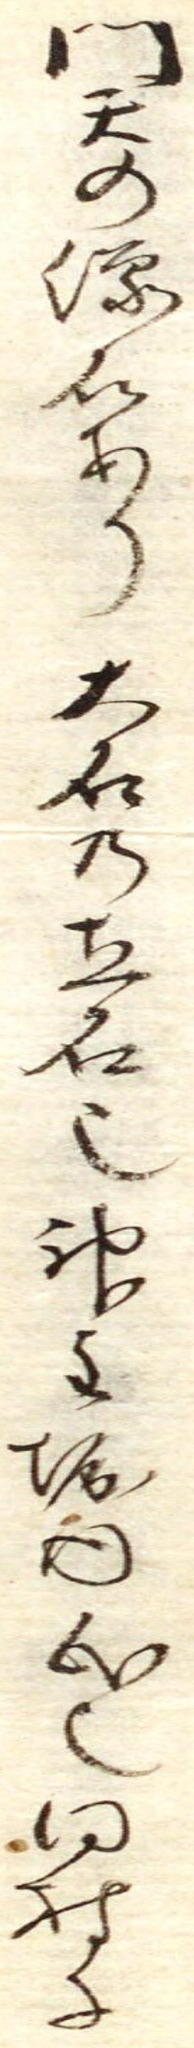門天の像石あり大石の立石也神主堀内氏也同村に
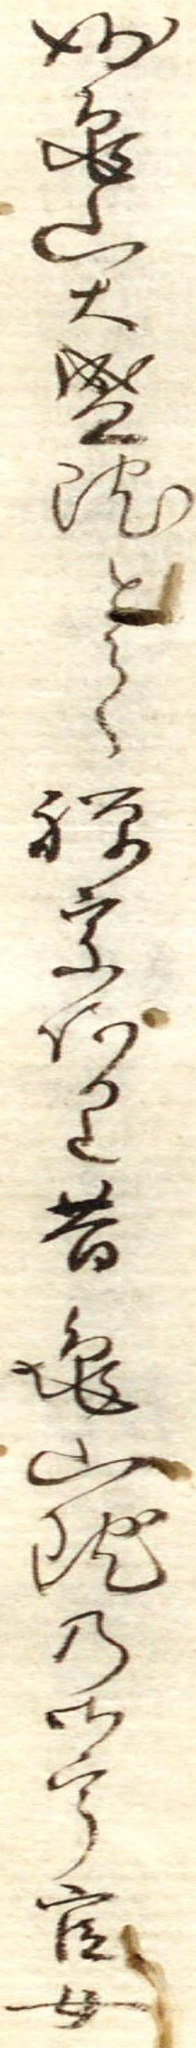妙亀山大盛院とて禅宗あり昔亀山院の御宇官女
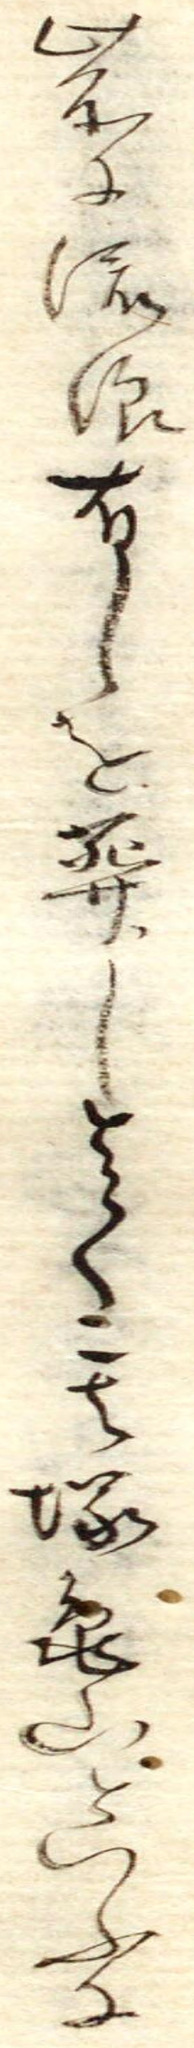此所に流浪有しを葬しとて其塚亀山といふに
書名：能登名跡誌
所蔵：Ishikawa Prefectural Library
